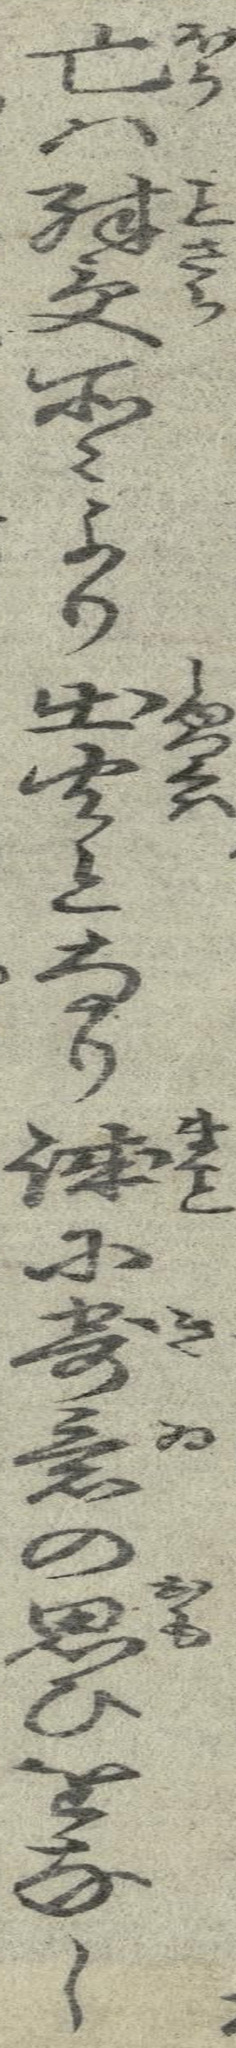亡は殊更所々より出火となり誠に寄意の思ひをなし
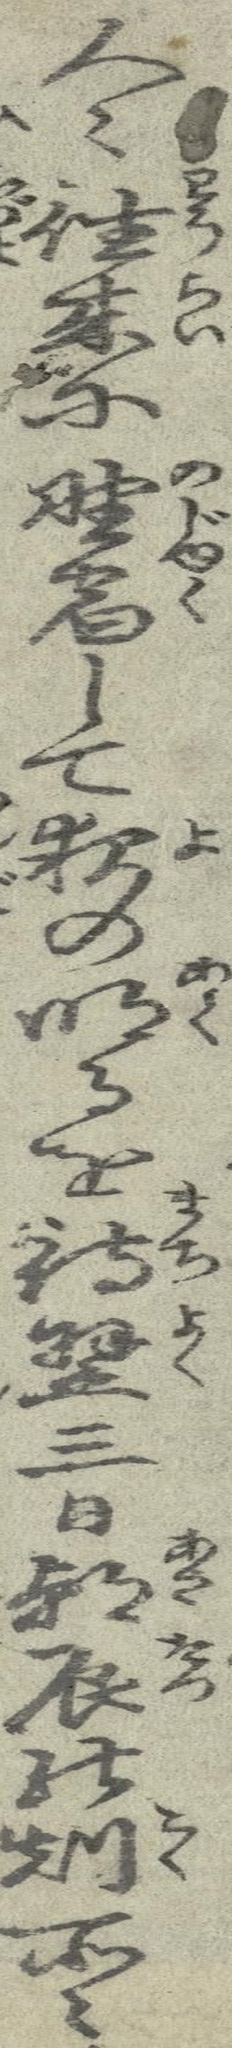人々往来に野宿して夜の明るを待翌三日朝辰の刻所々
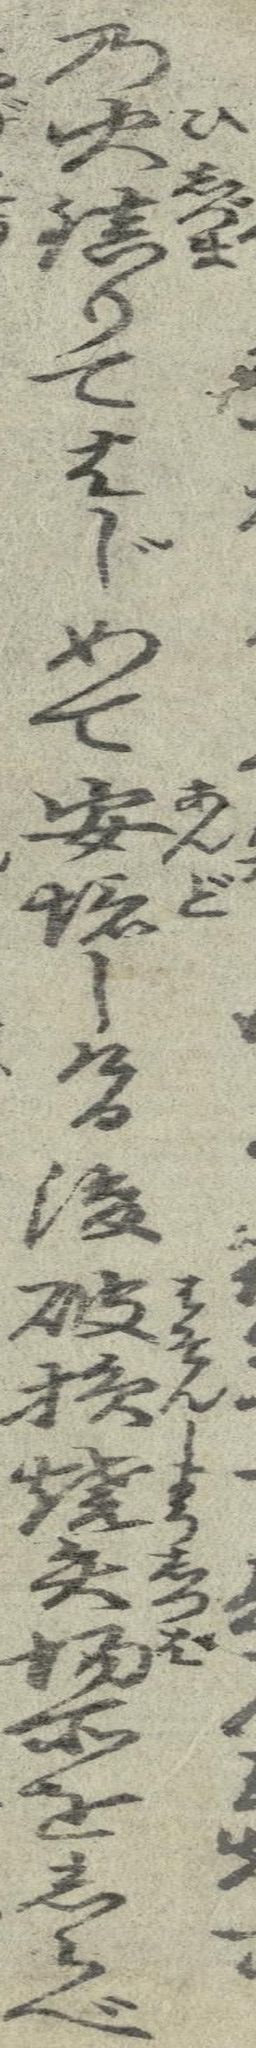の火鎮りてはじめて安堵しける後破損焼失場所をしらべ
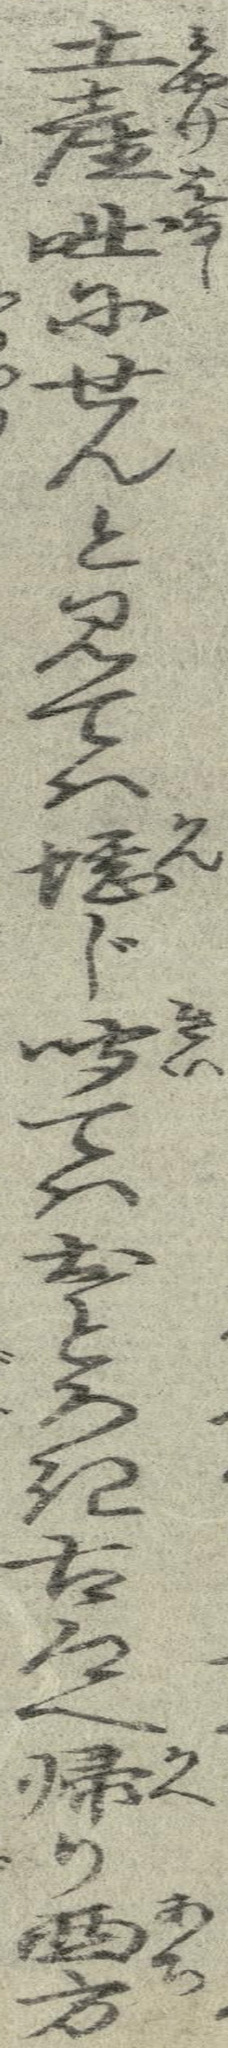土産咄にせんと見ては堪じ聞てはおとろき古郷へ帰り西方
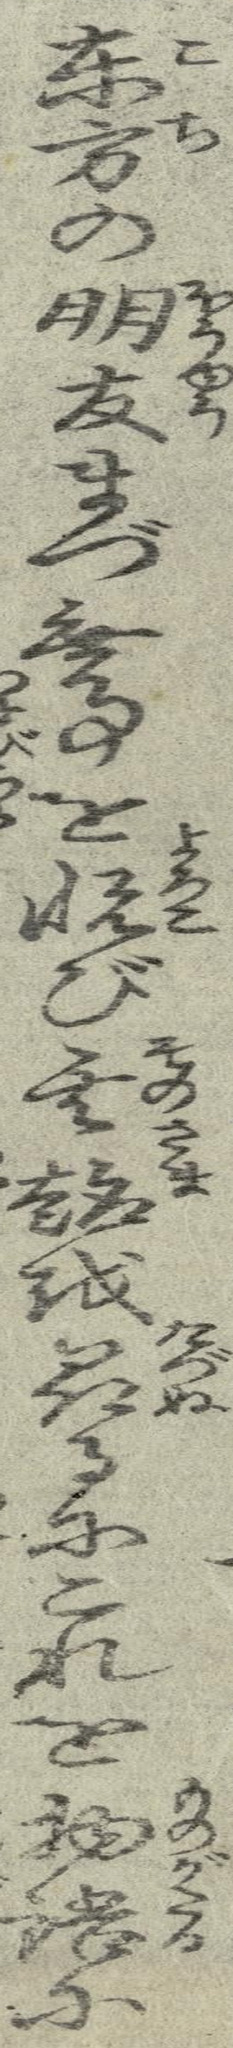東方の朋友まづ無事を悦び其趣を尋るにこれを物語に
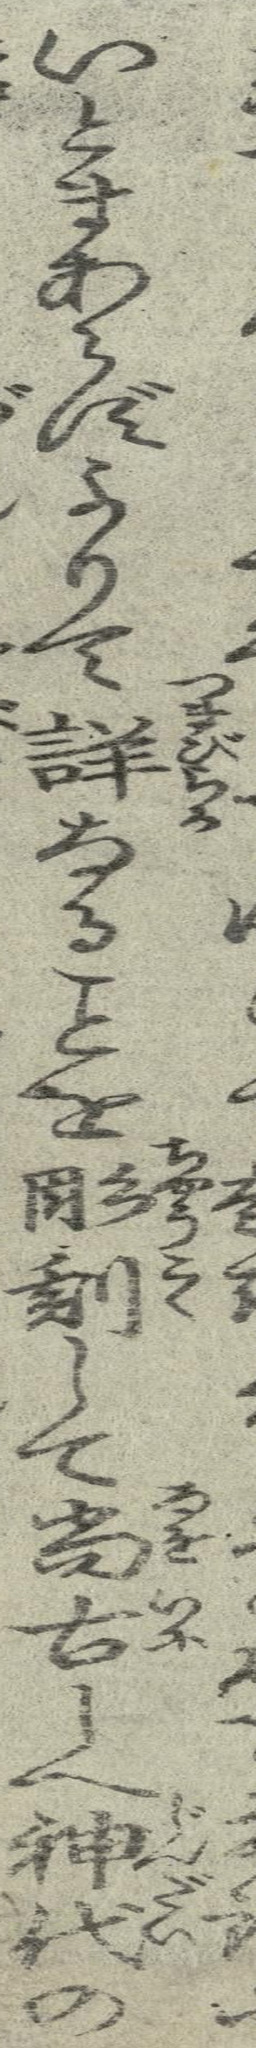いとまあらずよりて詳なることを彫刻して尚古しへ神代の
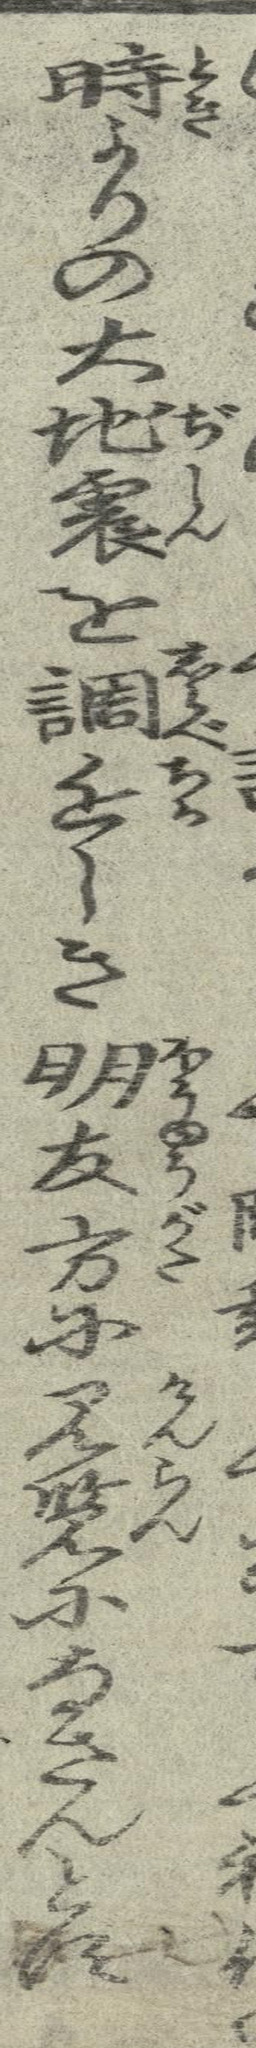時よりの大地震を調近しき朋友方に見覧になさんとす
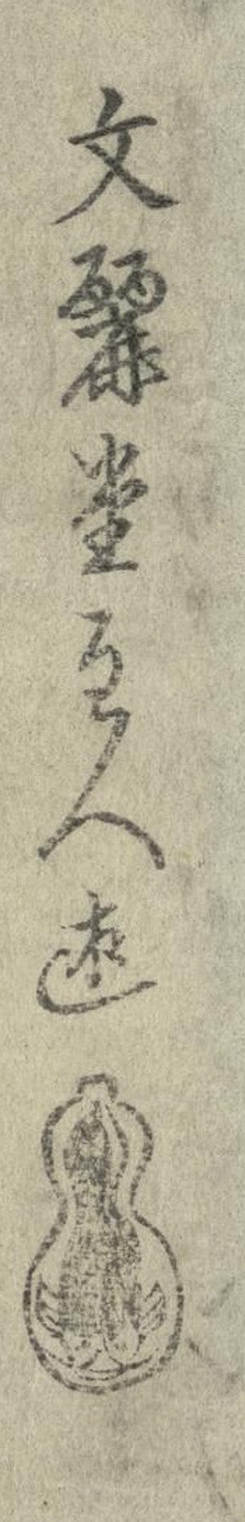文麗堂主人述
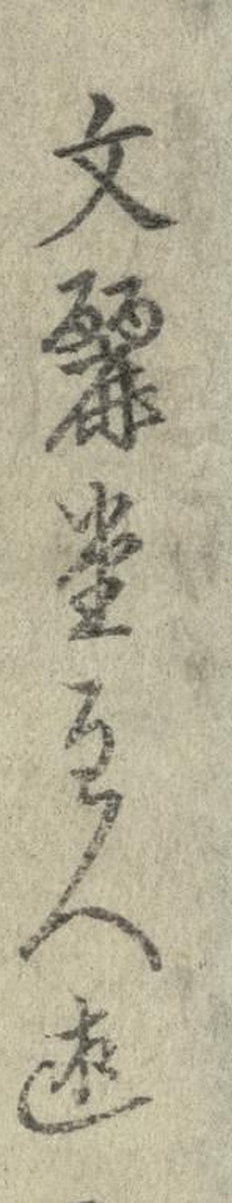文麗堂主人述
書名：地震年代記
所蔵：東京大学地震研究所図書室 Earthquake Research Institute Library, The University of Tokyo, JAPAN
